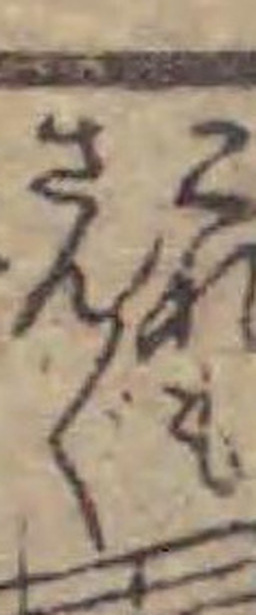さん〴〵
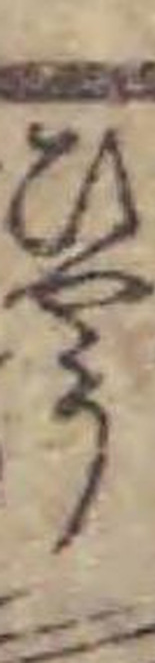ひやう
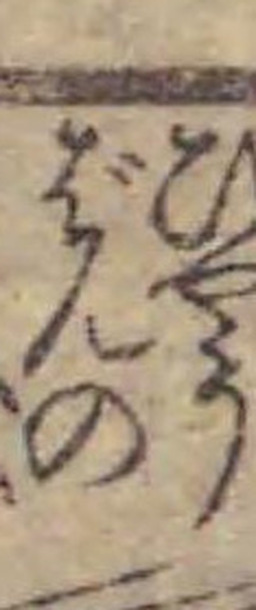ばんの
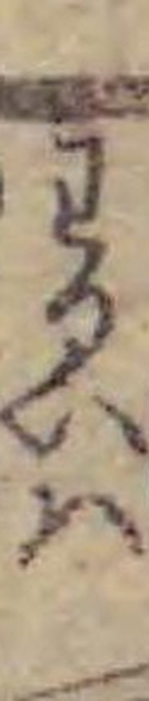わるいは
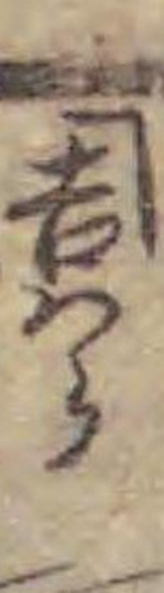〽吉はら
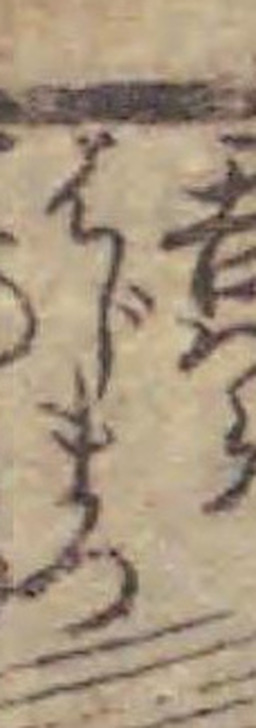はじまつ
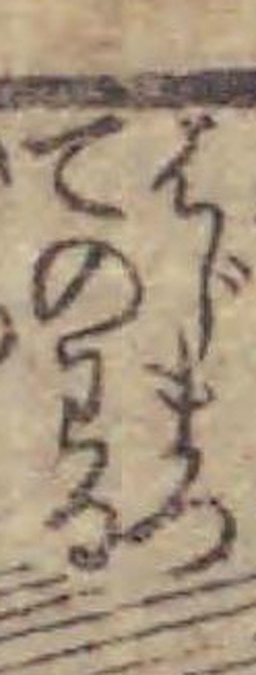てのわる

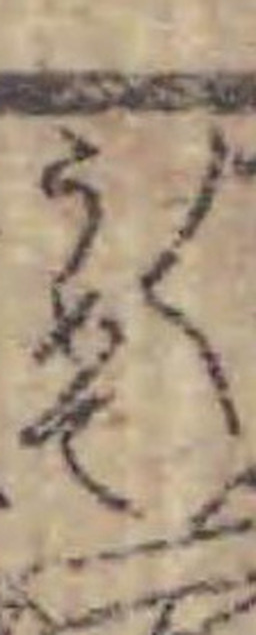うめて
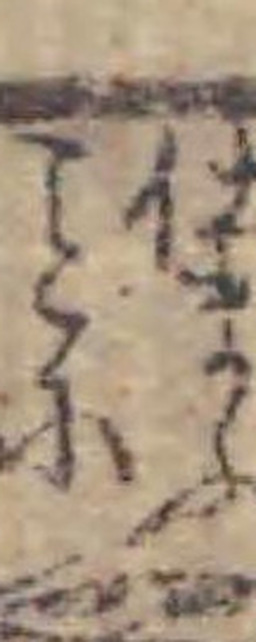ことに
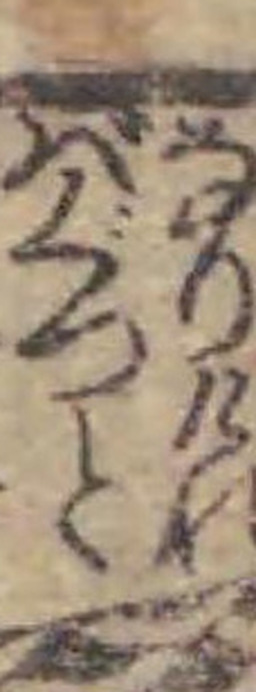ばぐつと
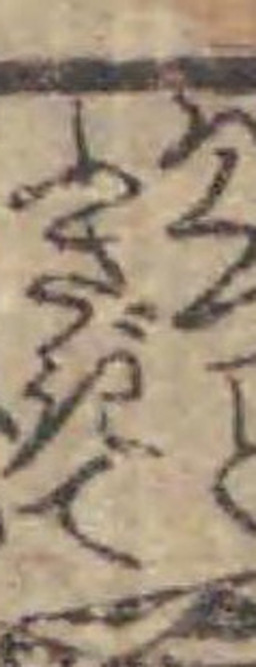ふさぎて
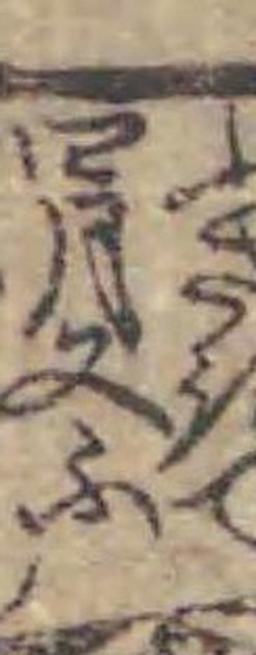四月又ふ
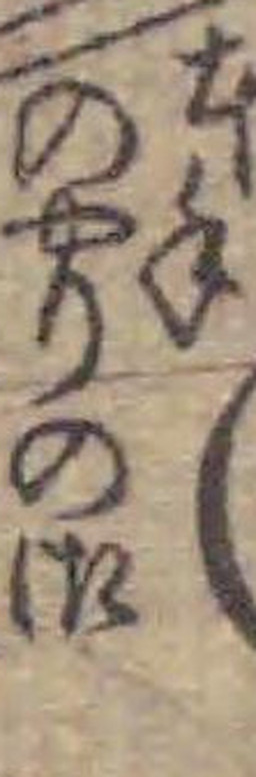のやりの御
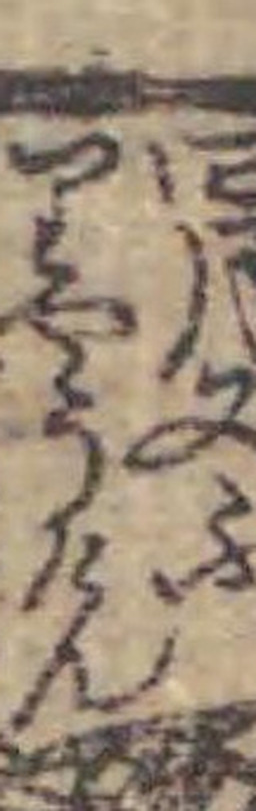りやうけん
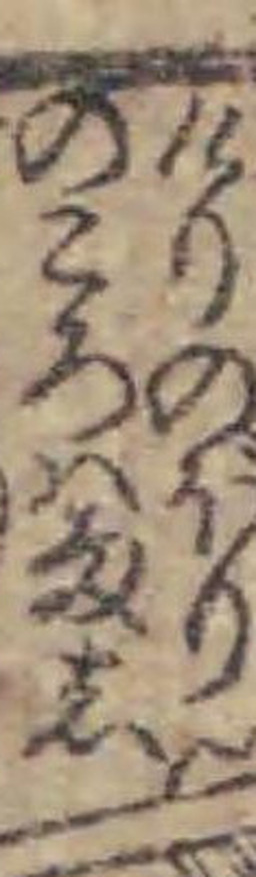のころは雨し
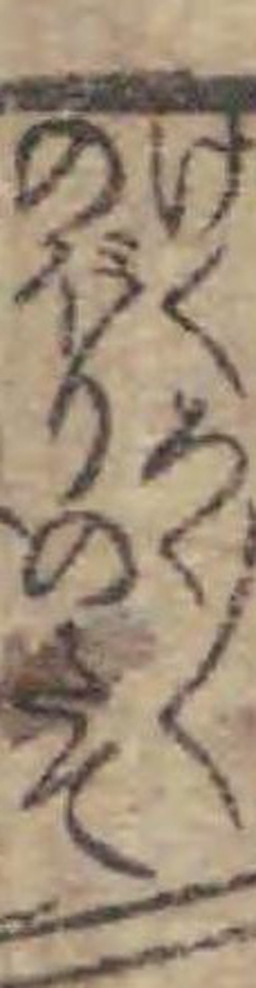のぼりのたて
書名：本樹真猿浮気噺 : 3巻
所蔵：国立国会図書館 National Diet Library, JAPAN
